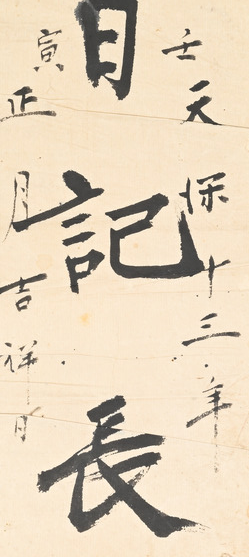日記長
